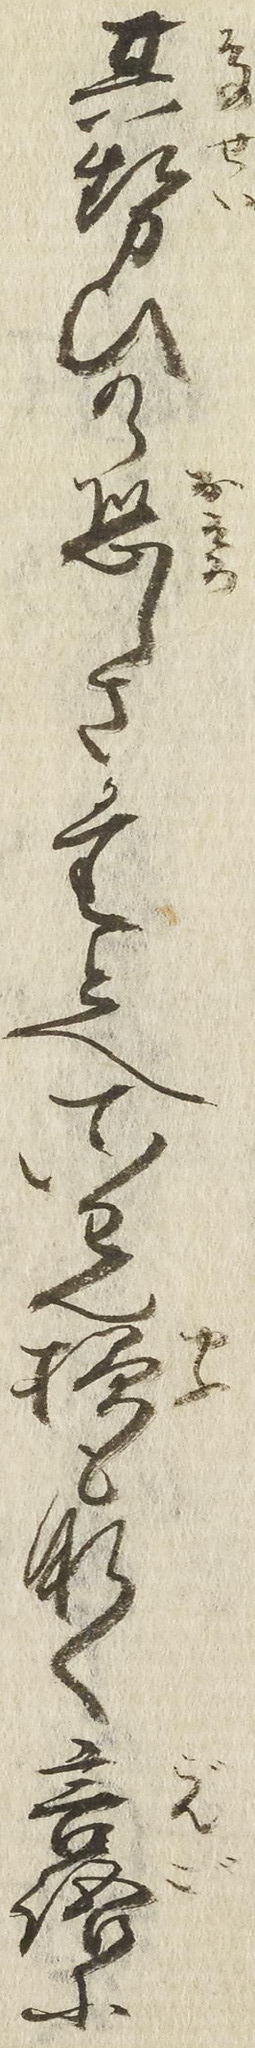其勢ひの恐しさたとへていわん様もなく言語に
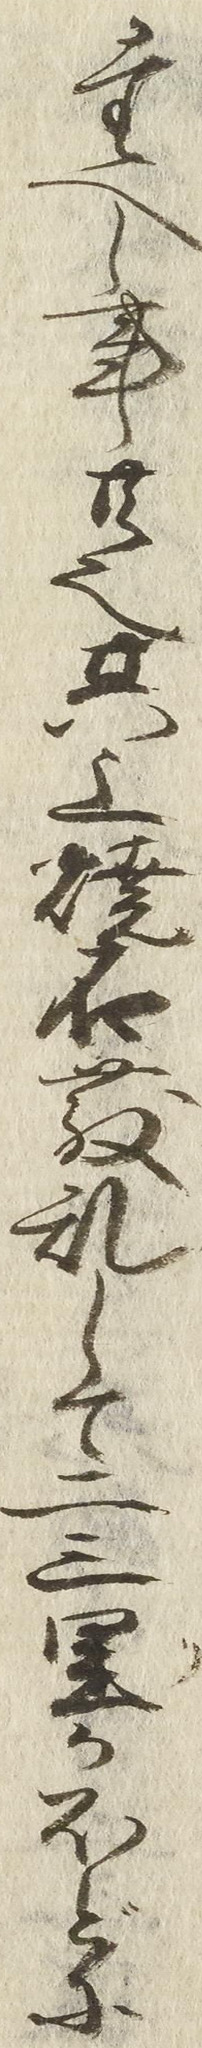たへし事共也其上焼石散乱してニ三里かほどに
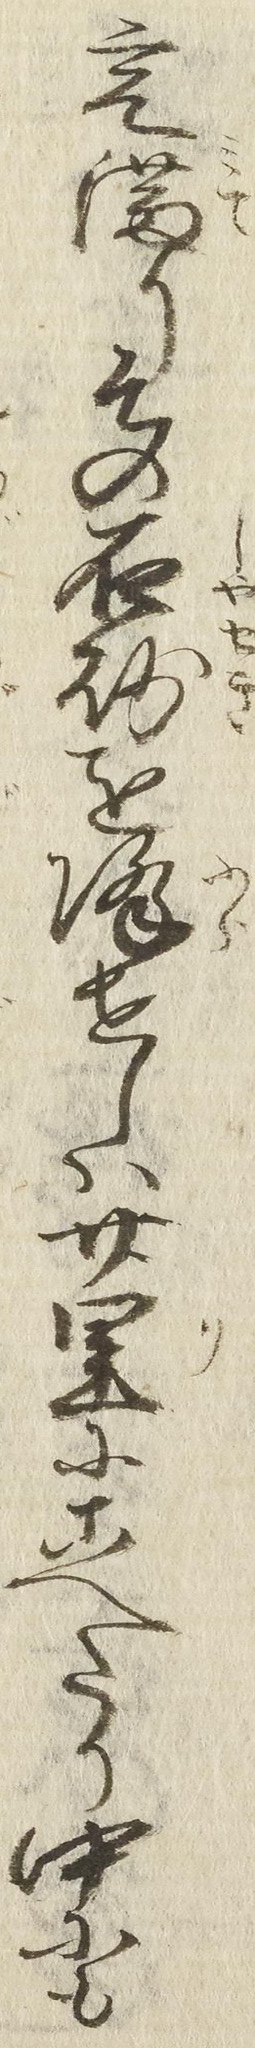充満りその石砂を降せしは廿里にこへたり中にも
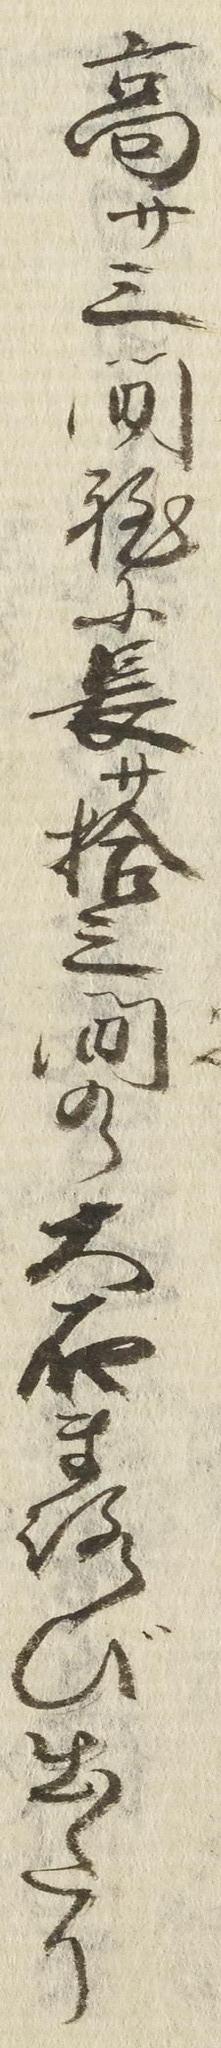高サ三間程に長サ拾三間の大石まろび出たり
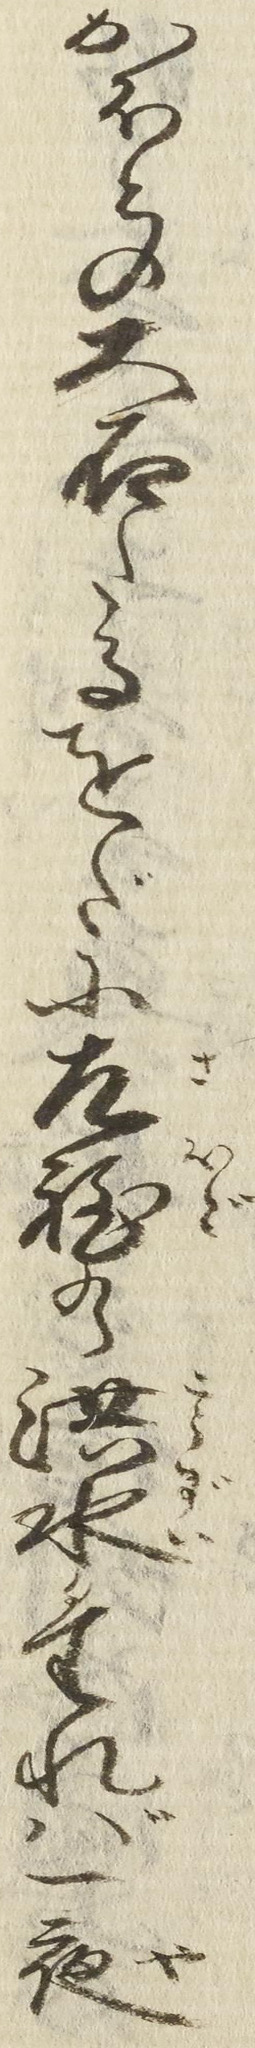かほとの大石たるをだに左程の洪水たれば一夜
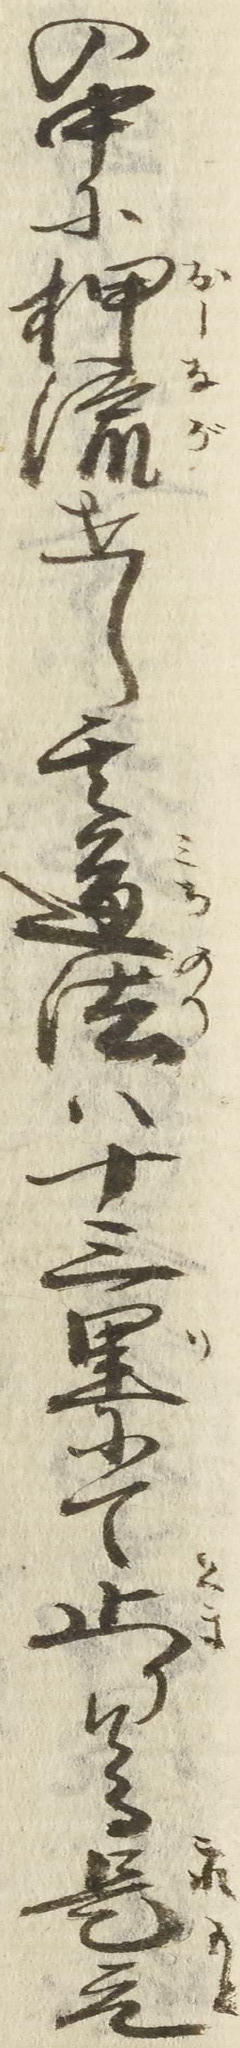の中に押流せし其道法は十三里にて止りける是元
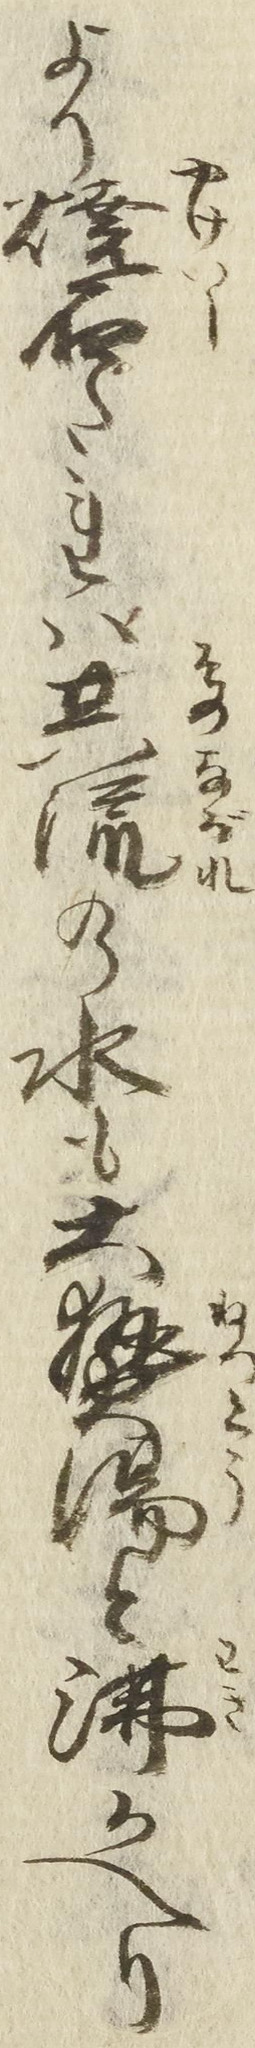より焼石たれば其流の水も大熱湯と沸かへり
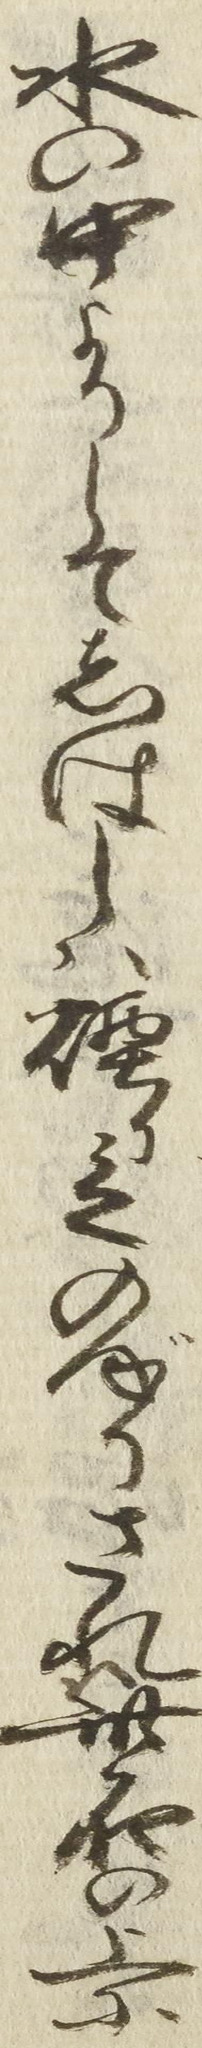水の中よりしてしはしは煙り立のぼりされは此石の上に
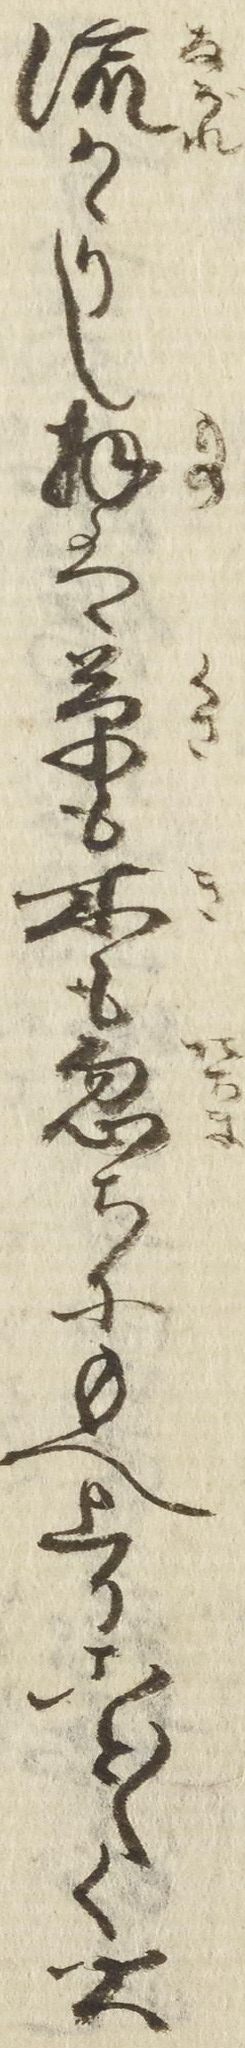流かゝりし物は草も木も忽ちにもへ上りこと〳〵く火
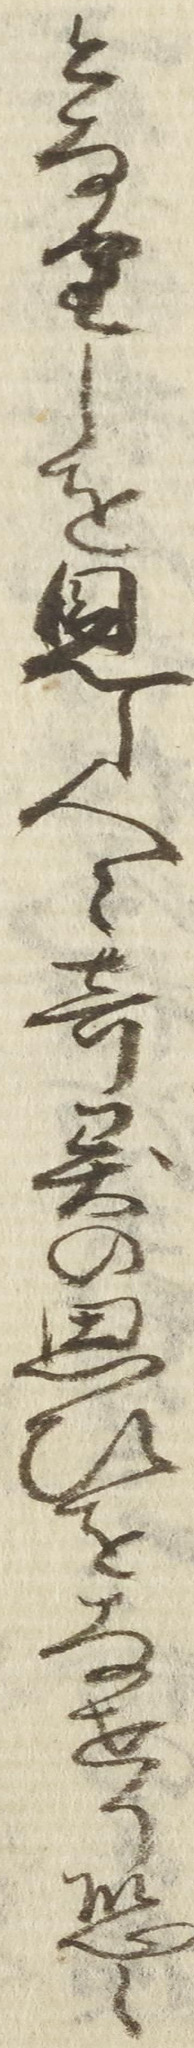となりしを見し人〻奇異の思ひをなせり恐〻
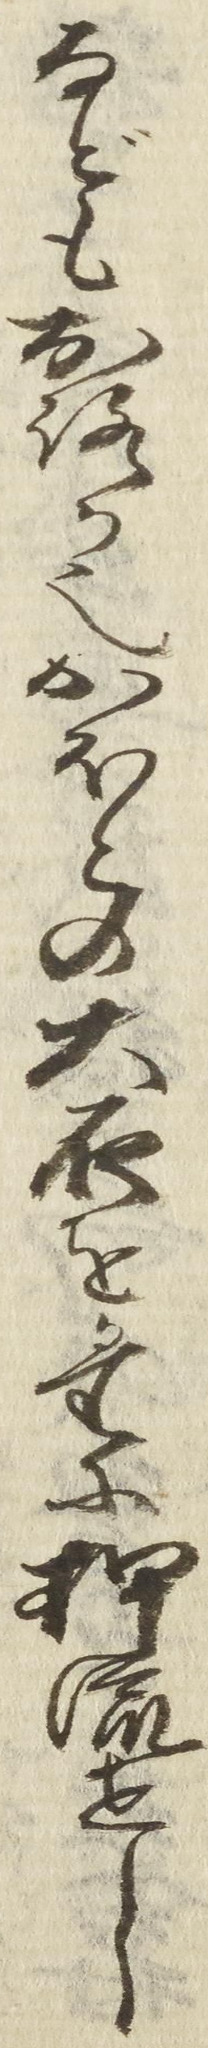などもおろか也かほとの大石をたに押流せし
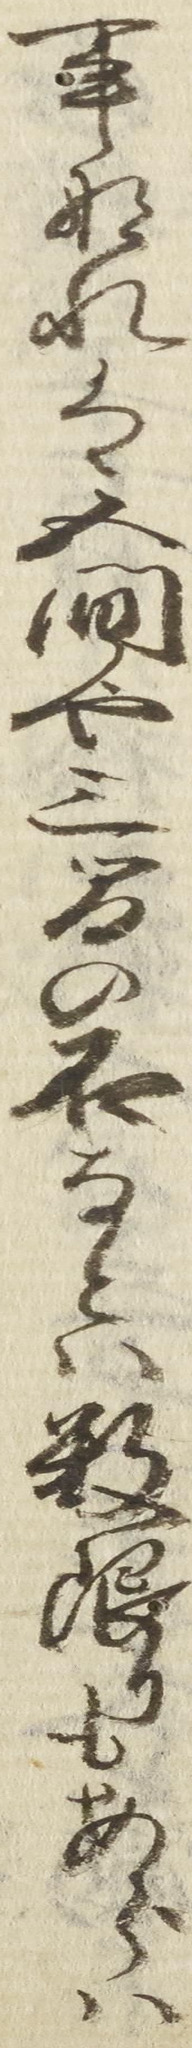事なれは五間や三間の石なとは数限りもあらは
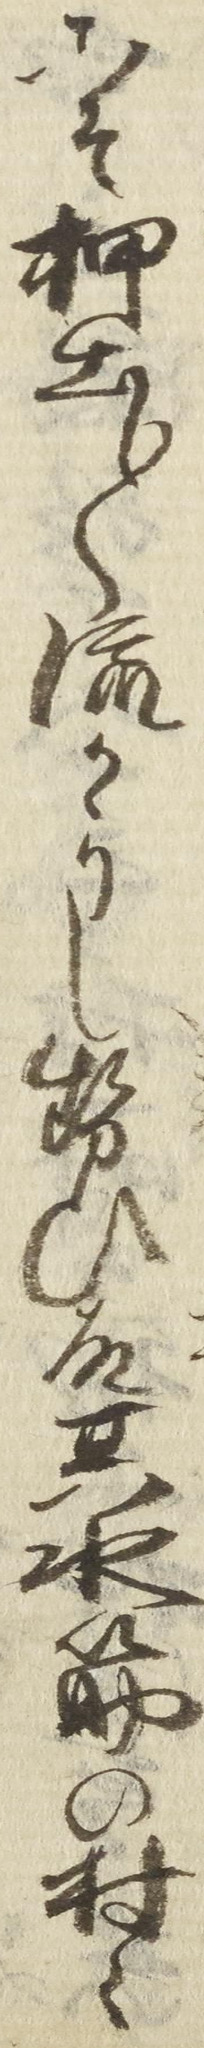こそ押出し〳〵流かゝりし勢ひ故其水筋の村〻

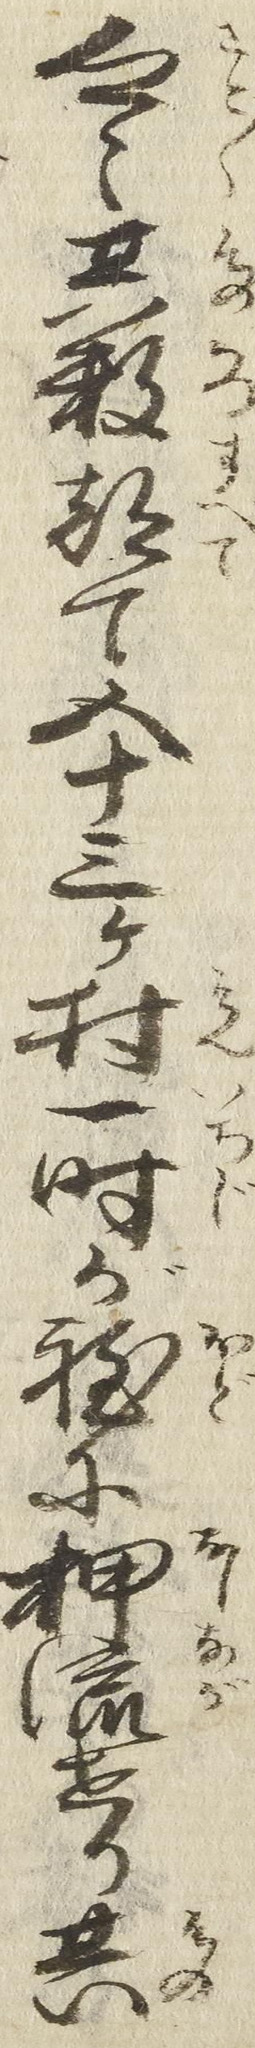郷〻其数都て五十三ケ村一時が程に押流せり其
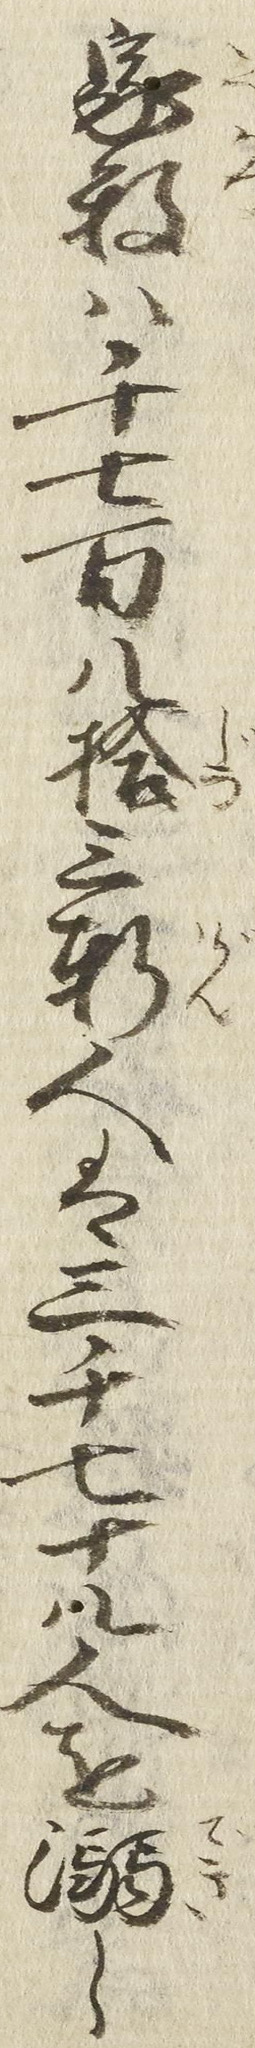家数は千七百八拾三軒人は三千七十八人を溺し
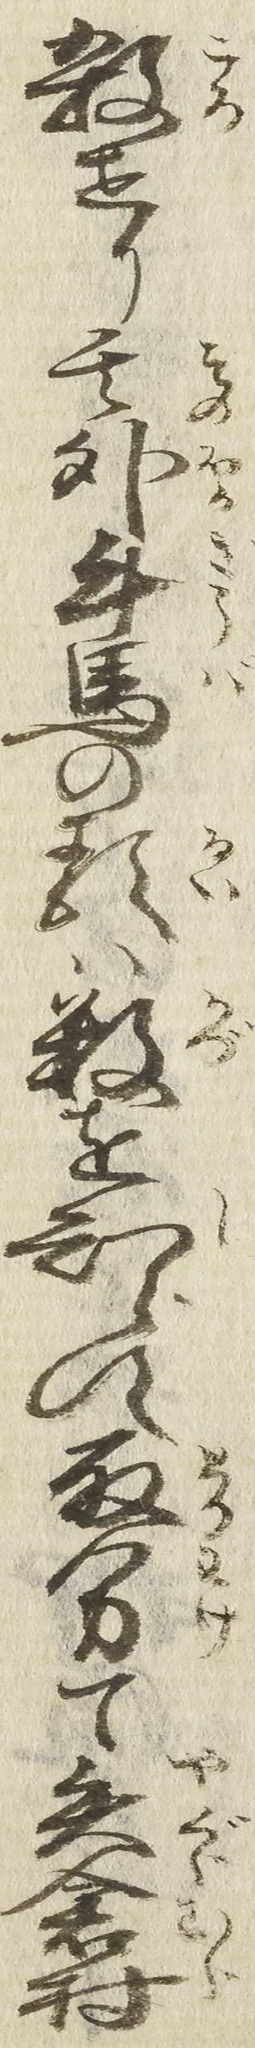殺せり其外牛馬の類は数を知らす取分て矢倉村
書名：天明奇畧　全
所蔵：東京大学地震研究所図書室 Earthquake Research Institute Library, The University of Tokyo, JAPAN
